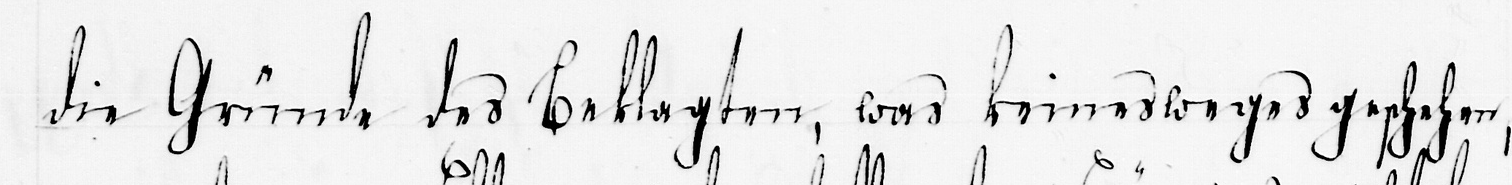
die Gründe des Beklagten, was keineswegs geschehe¬
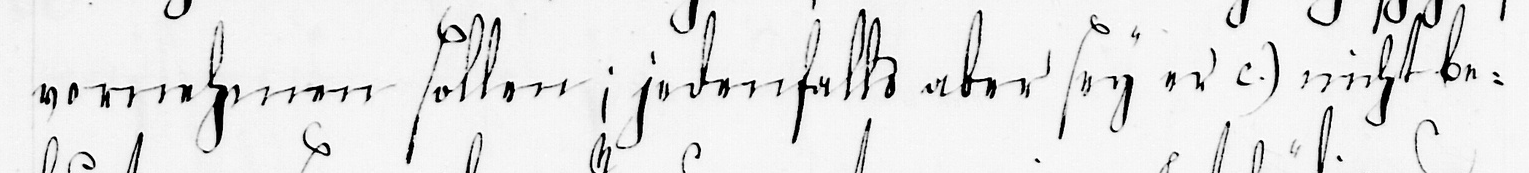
vernehmen sollen; jedenfalls aber sey er c.) nicht be¬
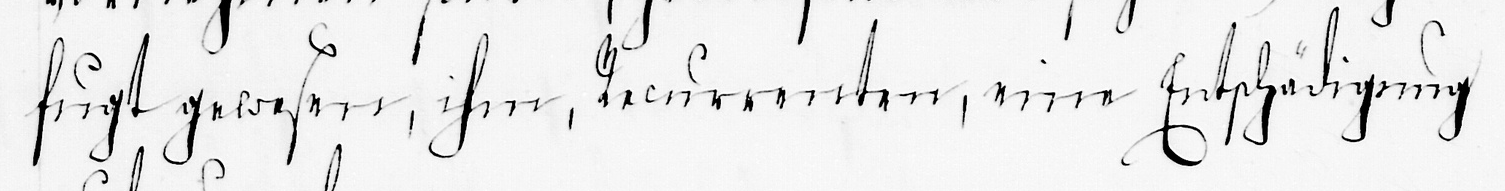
fugt gewesen, ihn, Recurrenten, eine Entschädigung
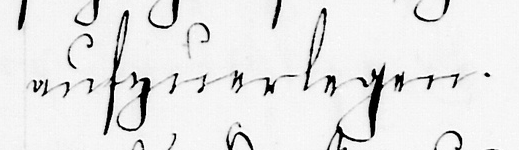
aufzuerlegen.
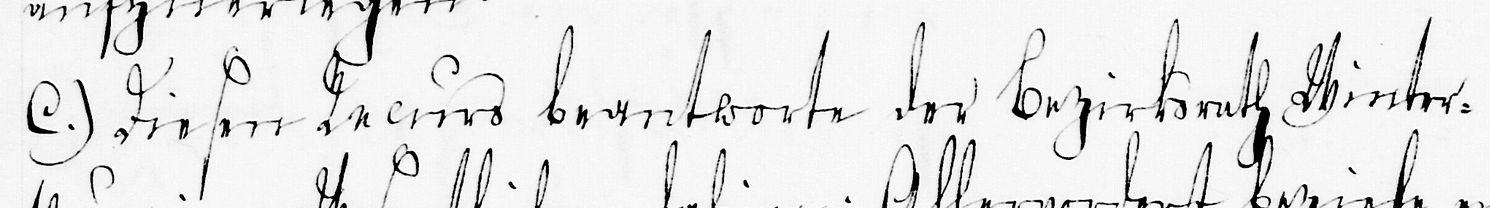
C.) Diesen Recurs beantworte der Bezirksrath Winter¬
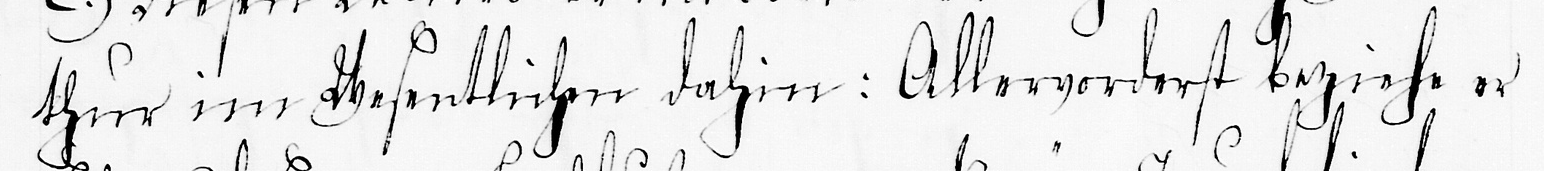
thur im Wesentlichen dahin: Allervorderst beziehe er
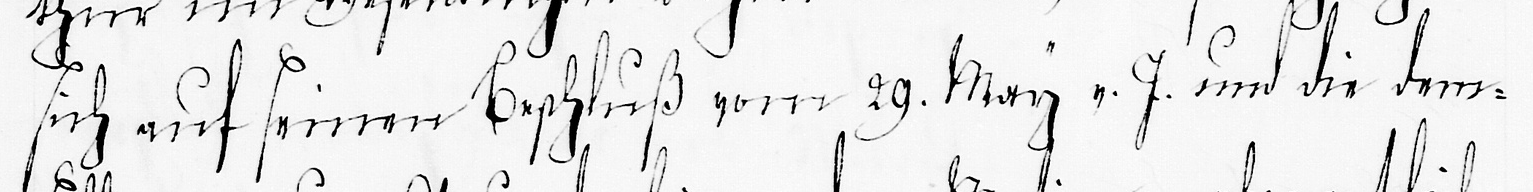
sich auf seinen Beschluß vom 29. März v. J. und die dem¬
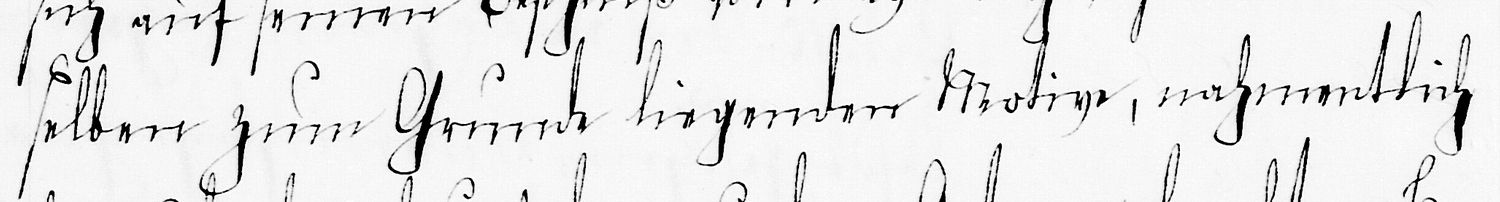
selben zum Grunde liegenden Motive, nahmentlich
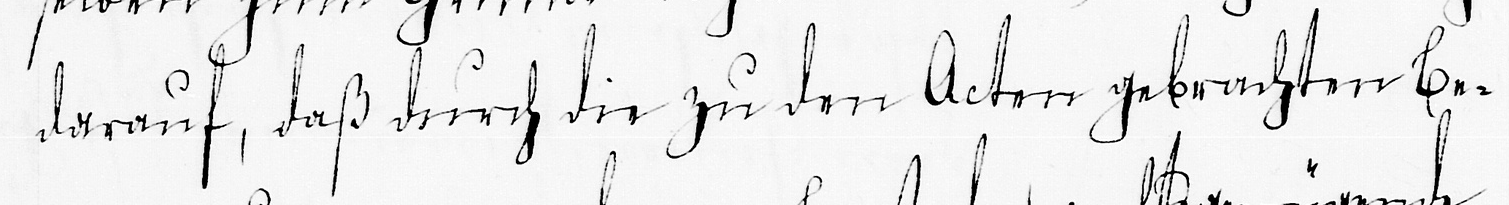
darauf, daß durch die zu den Acten gebrachten Be¬
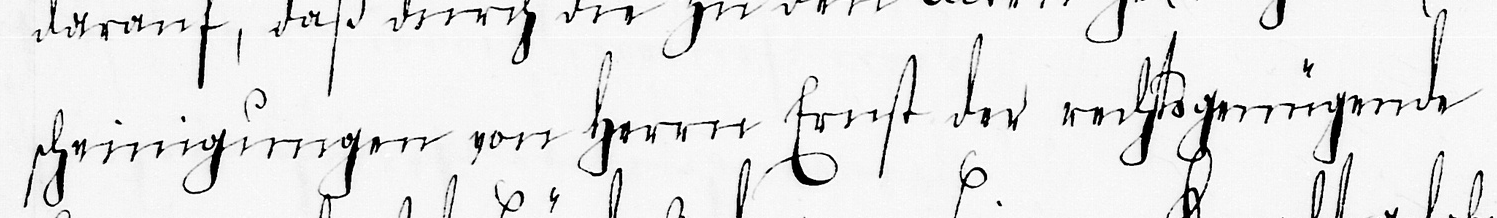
scheinigungen von Herrn Ernst der rechtsgenügende
